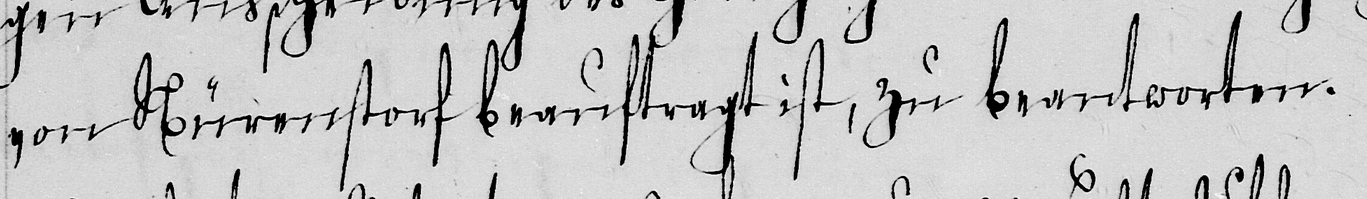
von Nürenstorf beauftragt ist, zu beantworten.
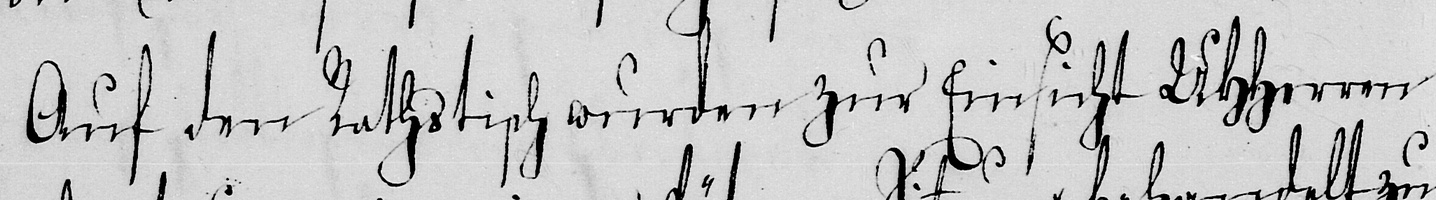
Auf den Rathstisch wurden zur Einsicht UHHerren
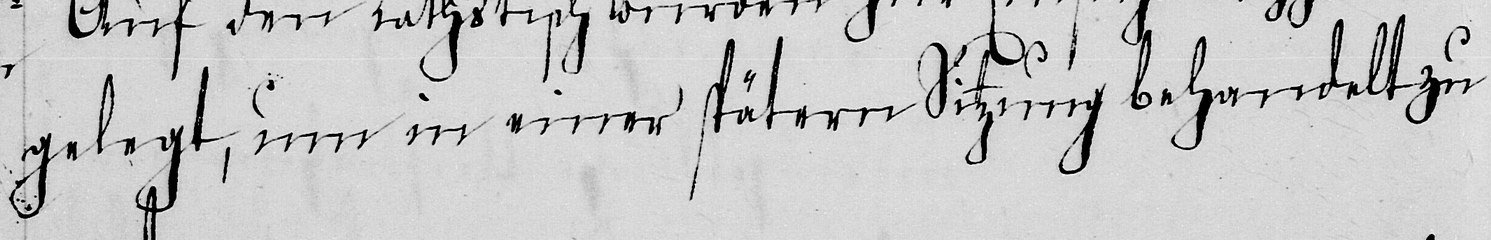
gelegt, um in einer spätern Sitzung behandelt zu
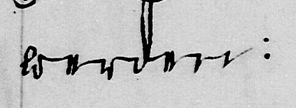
werden:
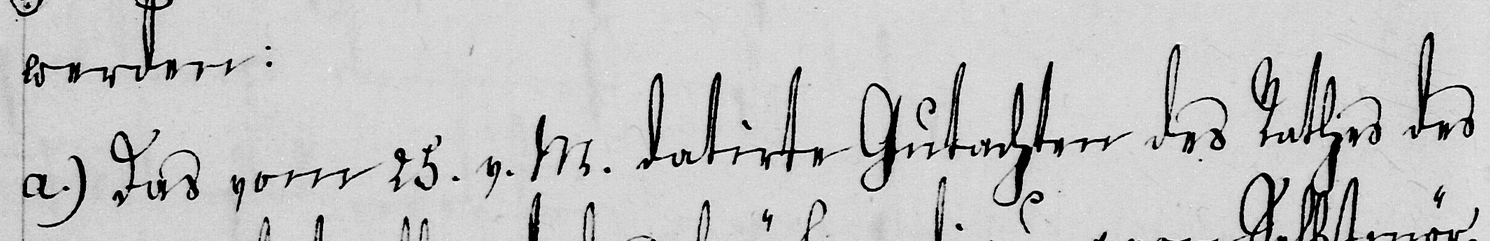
a.) Das vom 25. v. M. datirte Gutachten des Rathes des
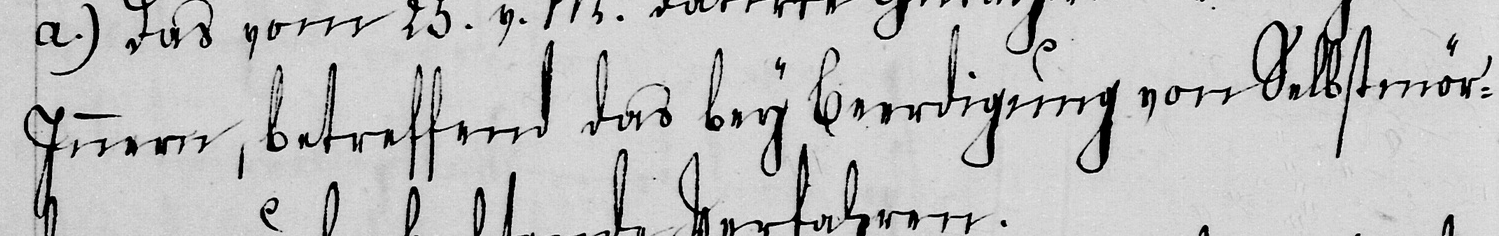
Innern, betreffend das bey Beerdigung von Selbstmör¬
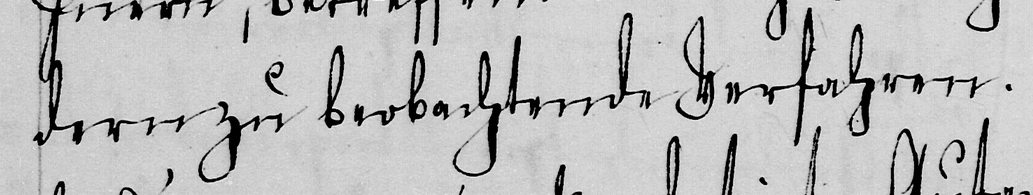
dern zu beobachtende Verfahren.
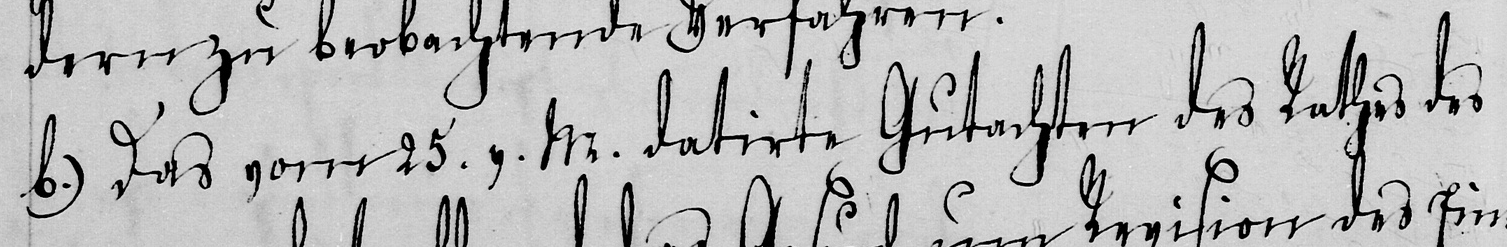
b.) Das vom 25. v. M. datirte Gutachten des Rathes des
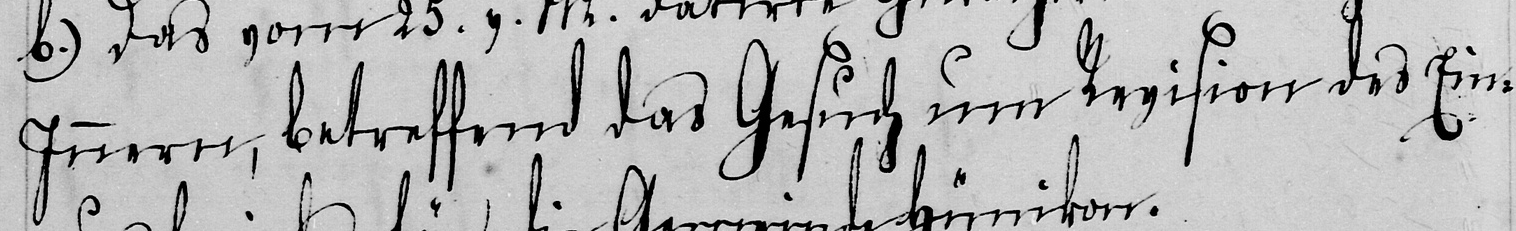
Innern, betreffend das Gesuch um Revision des Ein¬
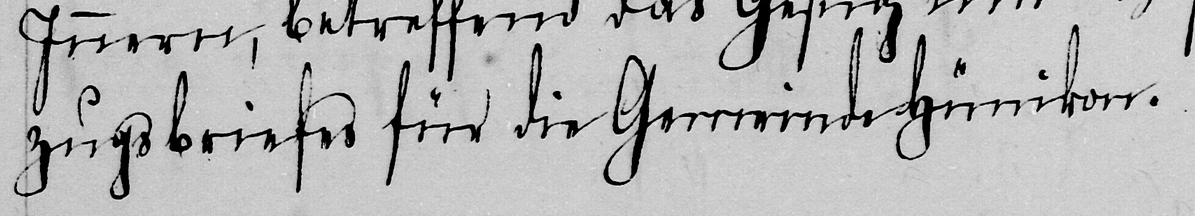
zugsbriefes für die Gemeinde Hünikon.
